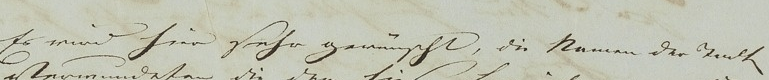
Es wird hier sehr gewünscht, die Namen der Todten
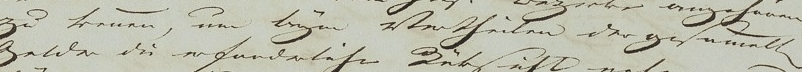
zu kennen, um beym Vertheilen der gesammelten
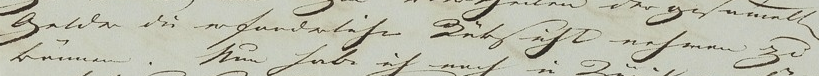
Gelder die erforderliche Rüksicht nehmen zu
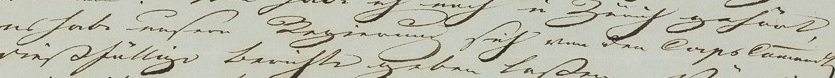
es habe unsere Regierung sich von den Corps Commandten
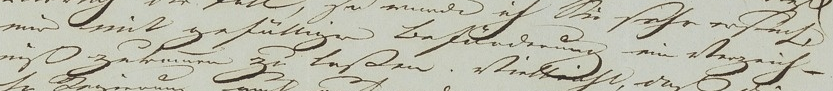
mir mit gefälliger Beförderung ein Verzeich-
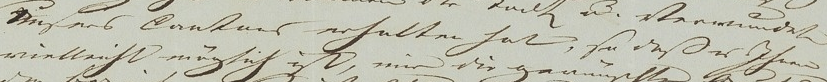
unsers Cantons erhalten hat, so daß es Ihnen
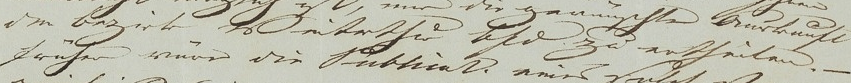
den Bezirk Winterthur bfd. zu ertheilen. -
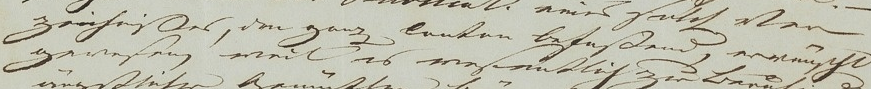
zeichnißes, den ganzen Canton befaßend, erwünscht
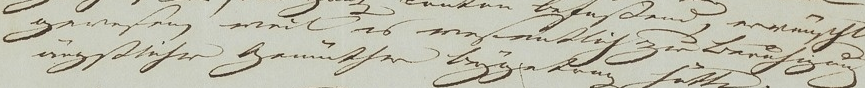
gewesen, weil es wesentlich zur Beruhigung
